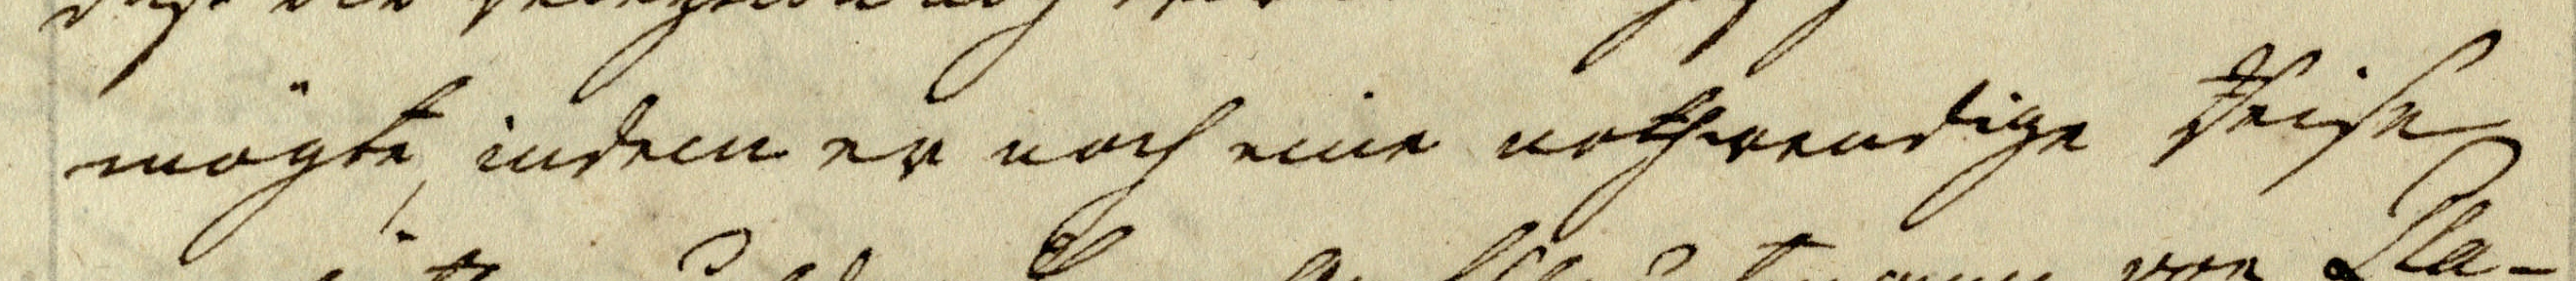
mögte, indem er noch eine nothwendige Reise
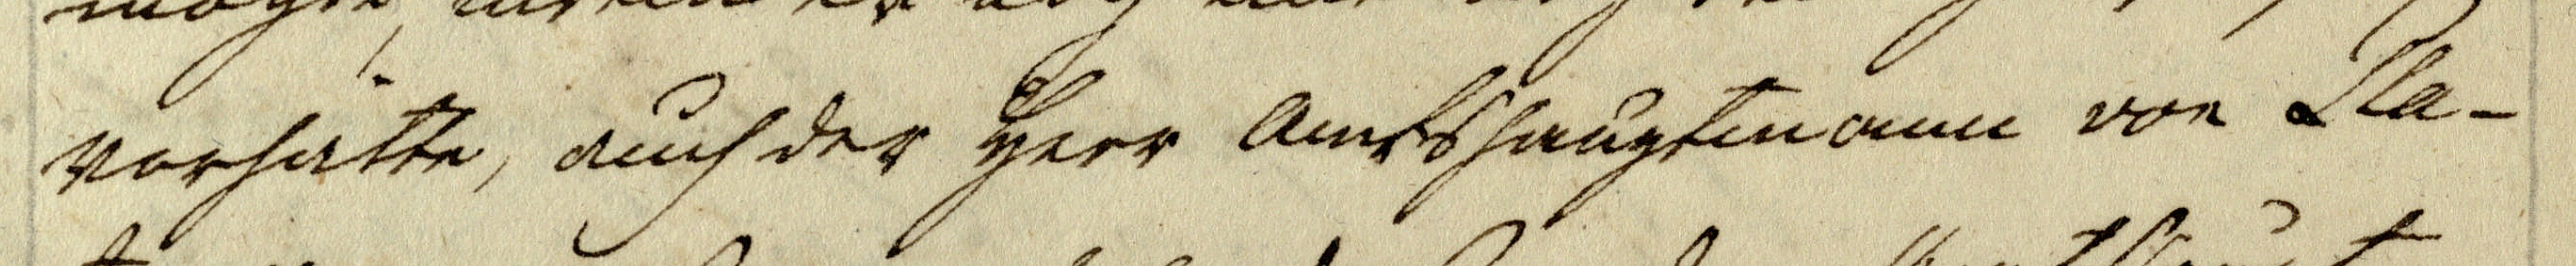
vorhätte, auch der Herr Amtshauptmann von Pla¬
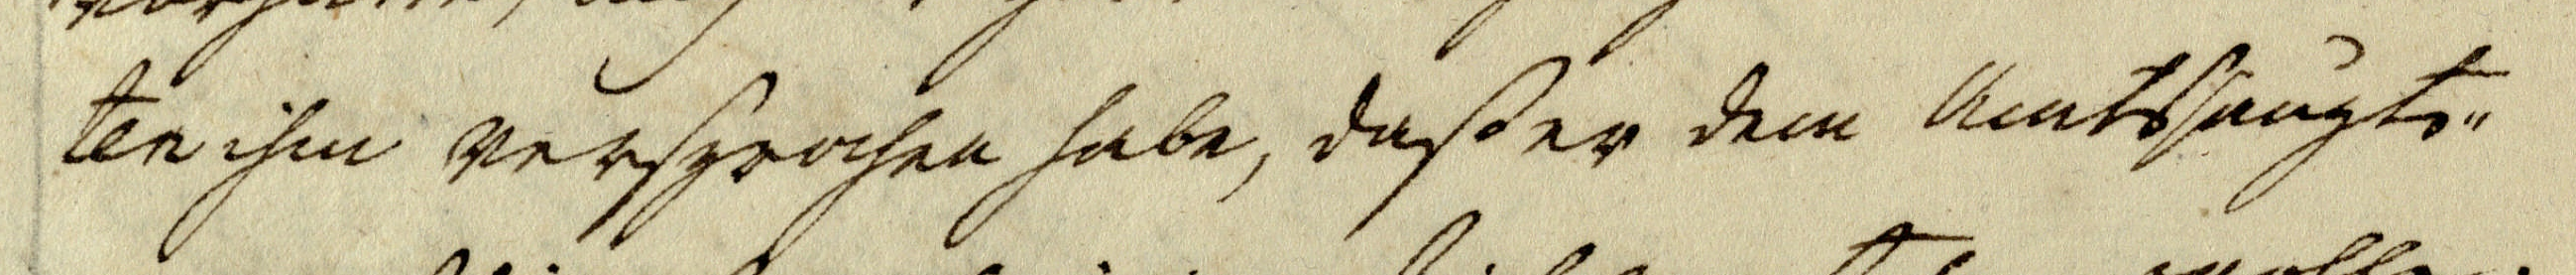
ten ihm versprochen habe, daß er dem Amtshaupt¬
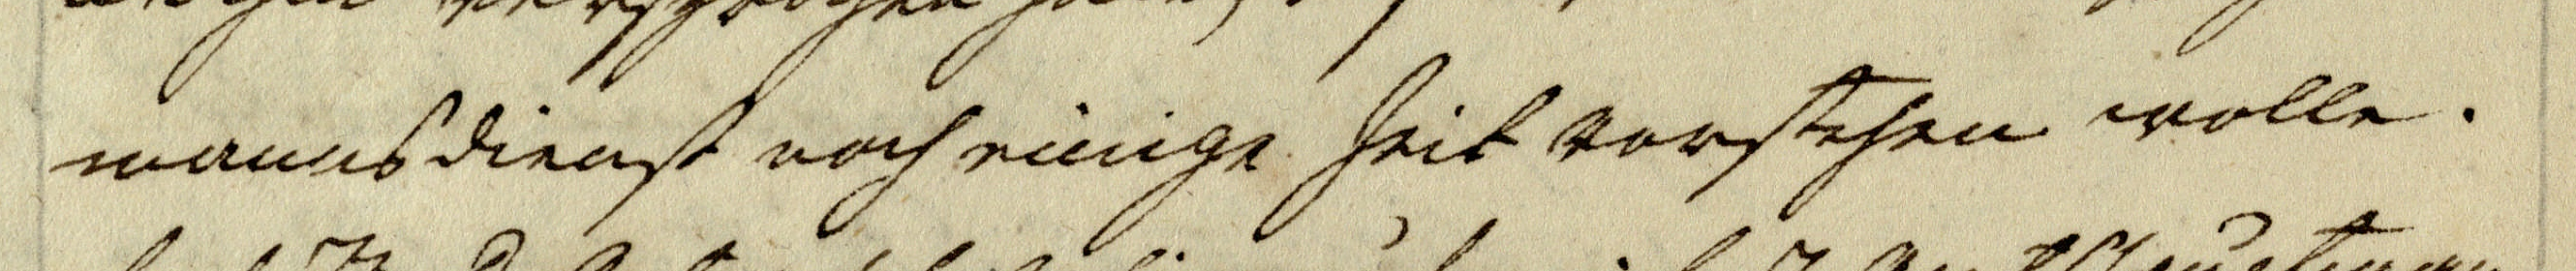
mannsdienst noch einige Zeit vorstehen wolle.
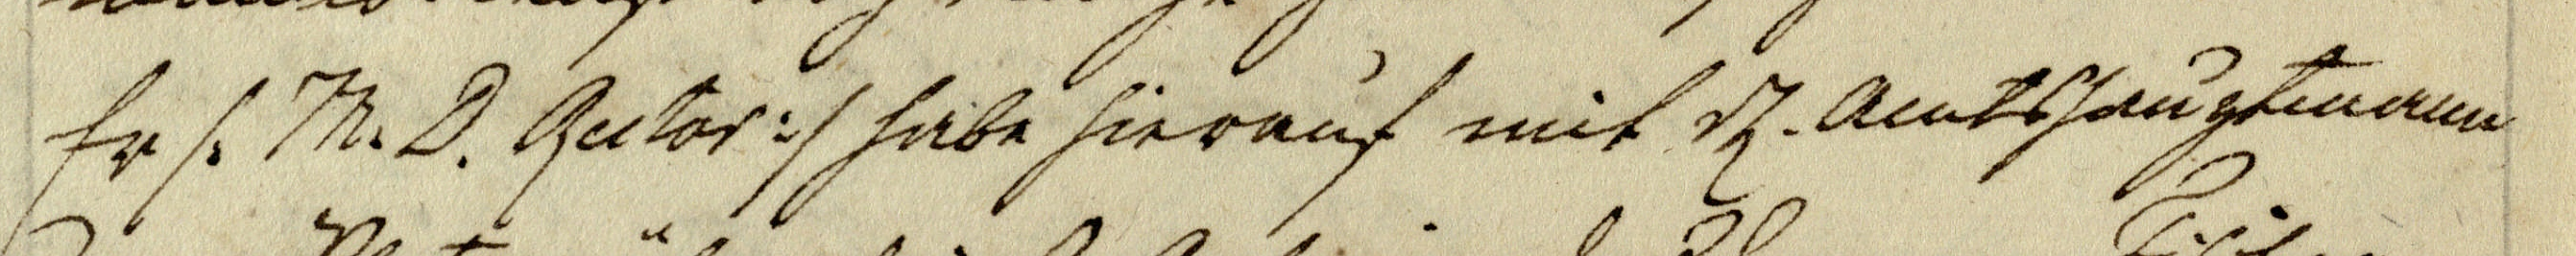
Er /. M. D. Rector :/ habe hierauf mit dh. Amtshauptmann
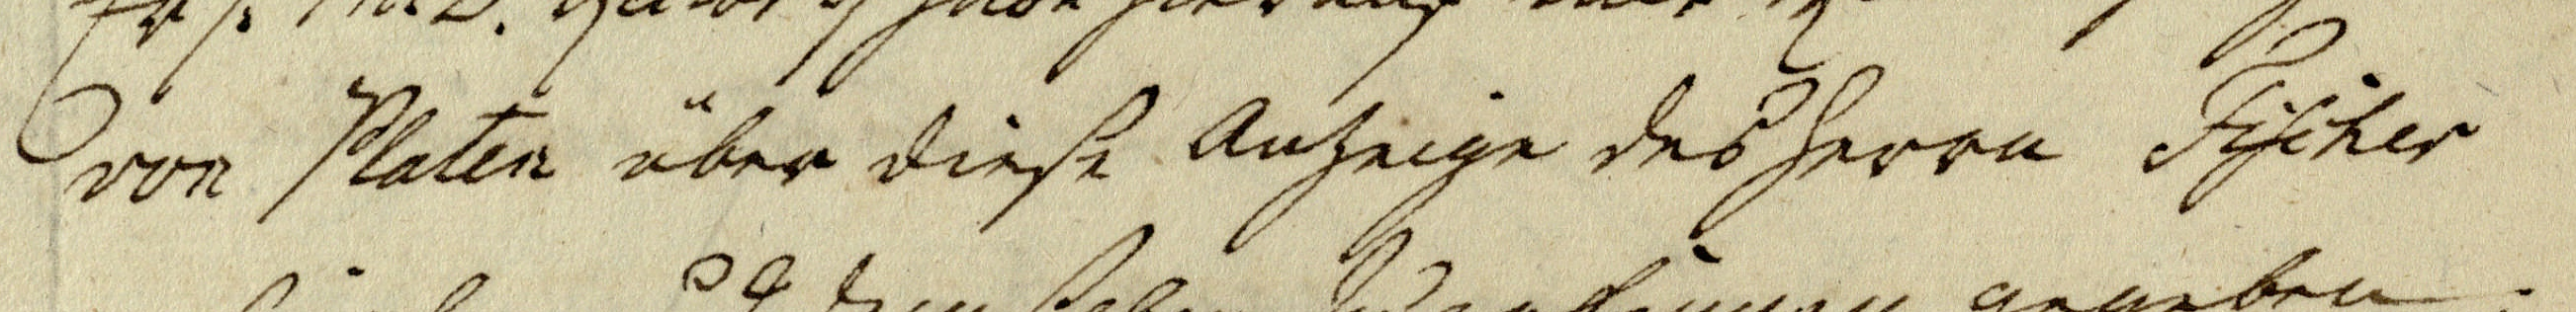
von Platen über diese Anzeige des Herrn Fischer
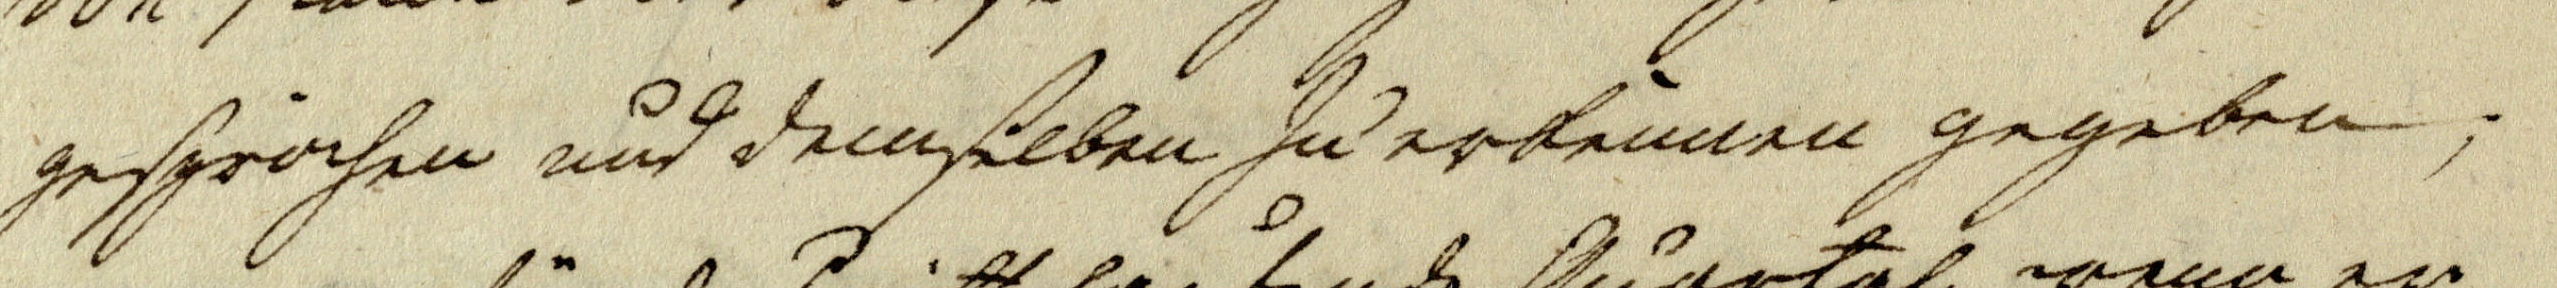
gesprochen und demselben zu erkennen gegeben;
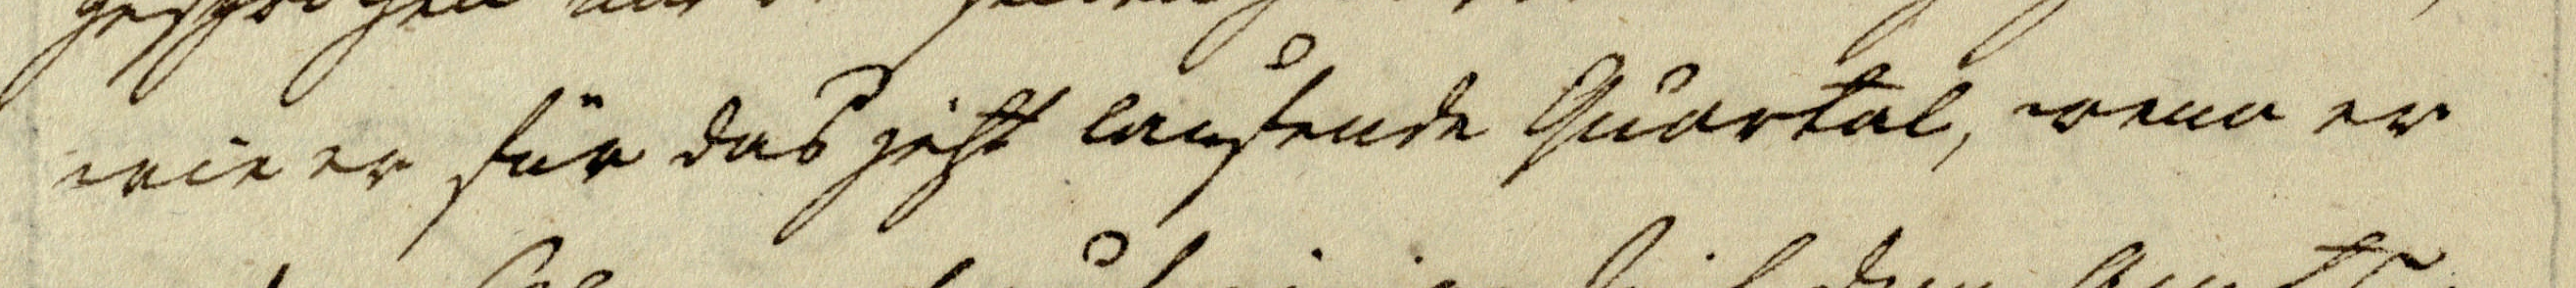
wie er für das jetzt laufende Quartal, wenn er
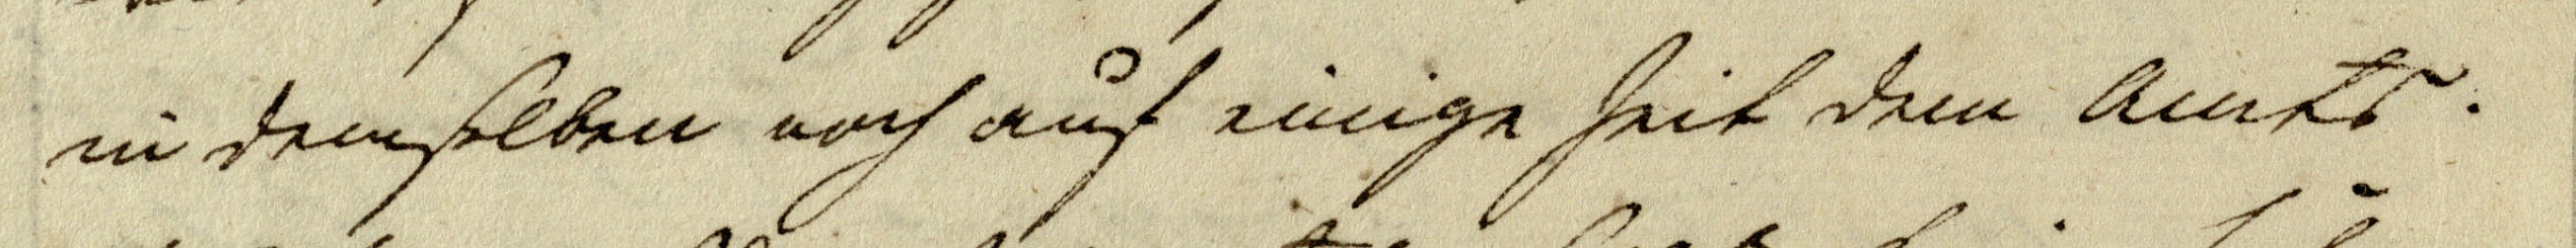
in demselben noch auf einige Zeit dem Amts¬
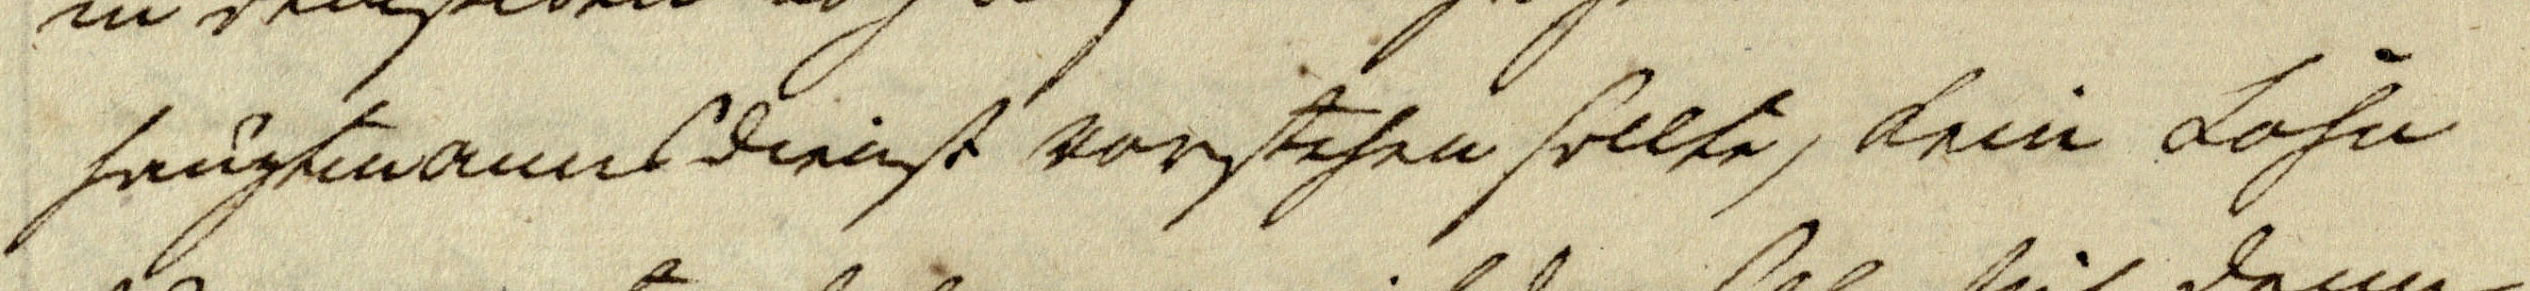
hauptmannsdienst vorstehen sollte, kein Lohn
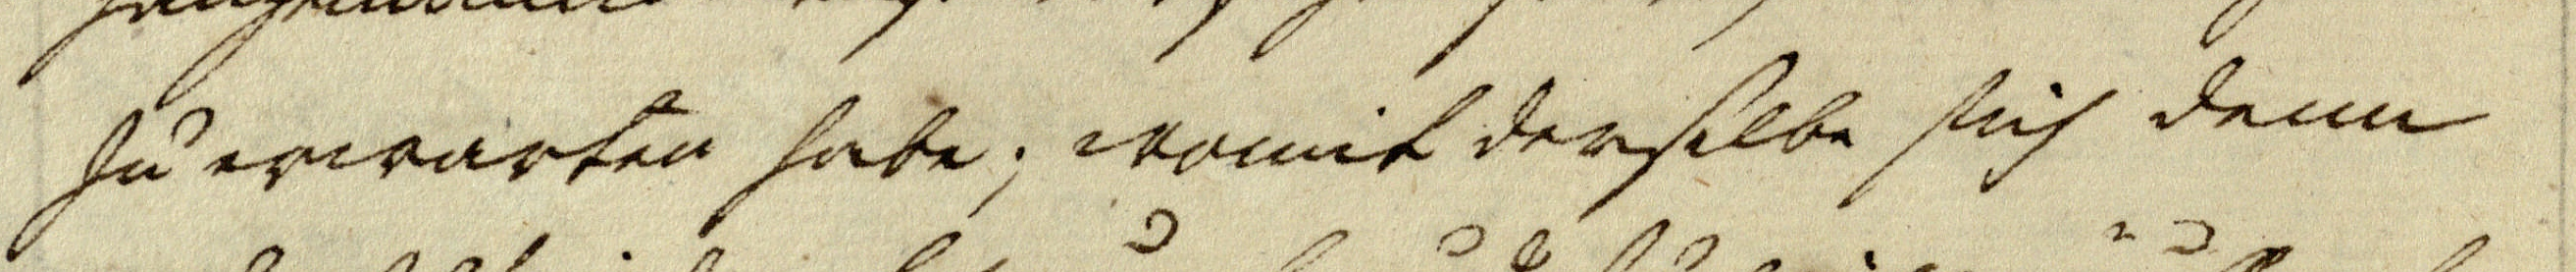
zu erwarten habe; womit derselbe sich denn
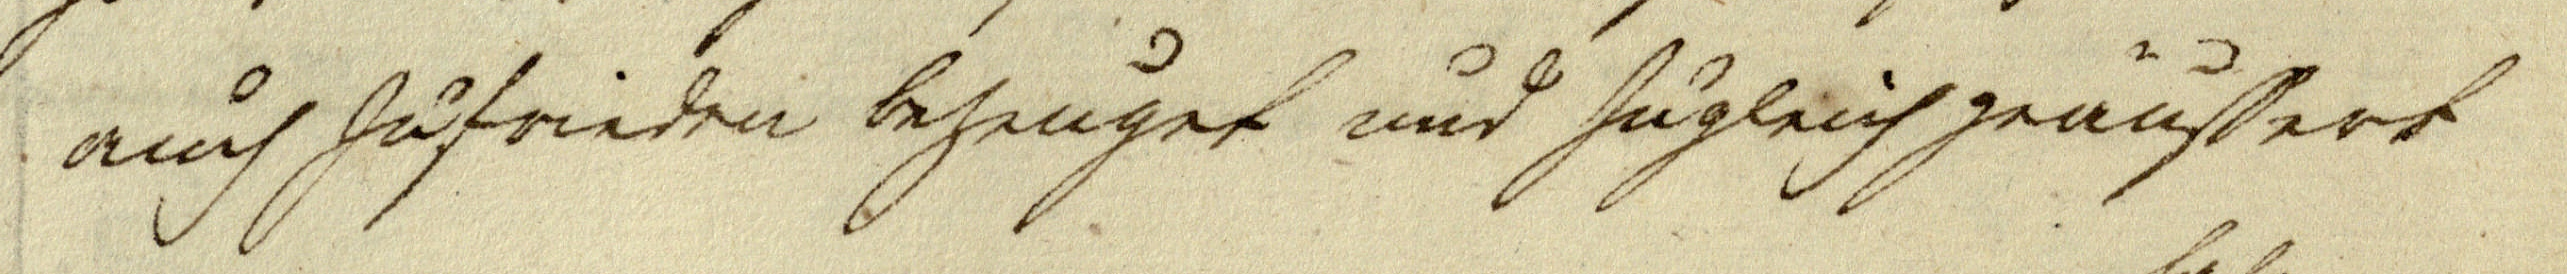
auch zufrieden bezeuget und zugleich geäussert
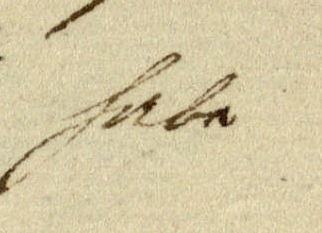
habe
